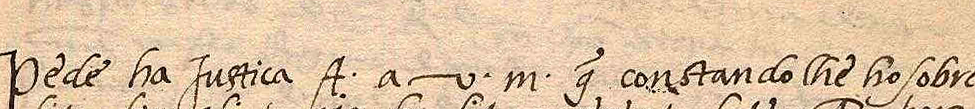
Pede ha Justiça A. a v. m. q̄ constando lhe ho sobre
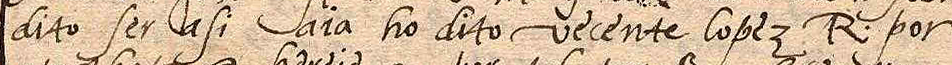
dito ser asi aia ho dito vecente lopez R. por
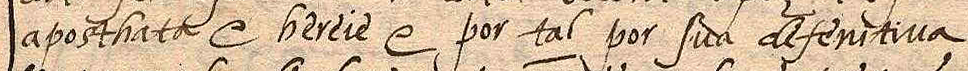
aposthata e hereie e por tal por sua defenitiua
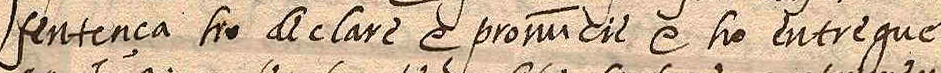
sentença ho declare e pronūcie e ho entregue
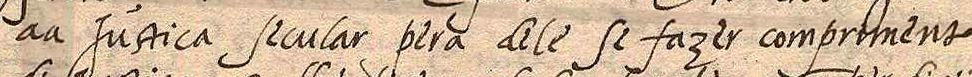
aa Justiça secular pera dele se fazer comprimento
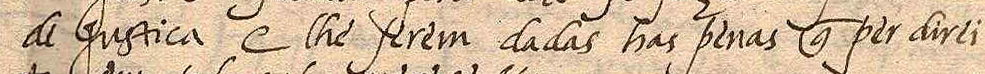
de Justiça e lhe serem dadas has penas q̄ per direi
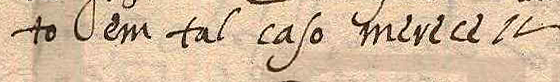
to em tal caso merece //
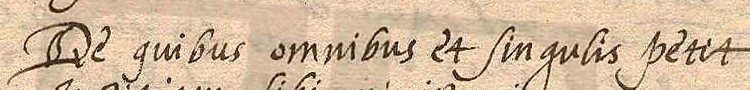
De quibus omnibus et singulis petit
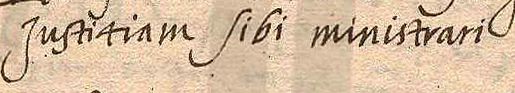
Justitiam sibi ministrari
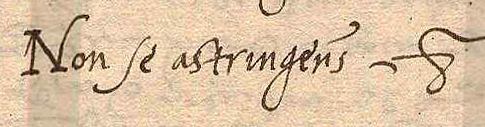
Non se astringens̄ cꝭ
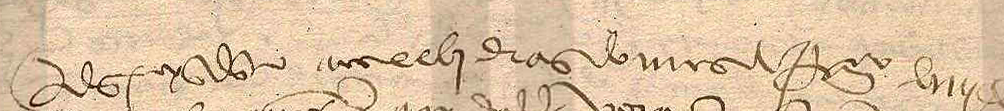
E despoys desto aos xxbj dias do mes de feuro de mjll
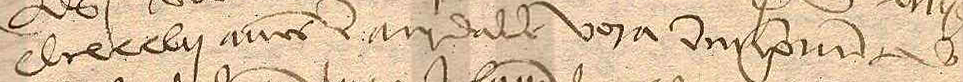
e bc xxxbij anos ē a cydade devora ē cunp̄mēto do
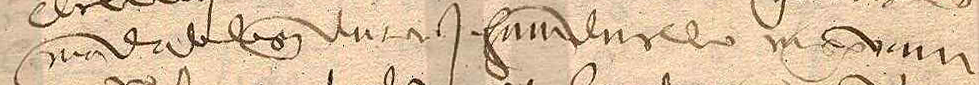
mādado do s̄r doutor Joham de mello eu esp̄vam
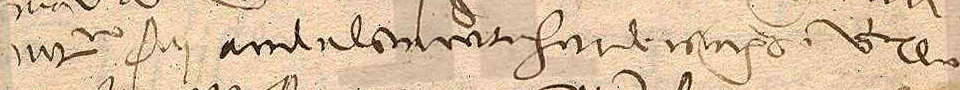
notro fuj a cadea desta corte honde esta p̄so vte llo
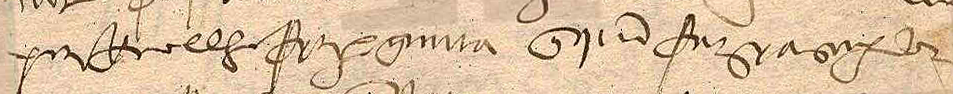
pez Reo e lhe fyz ꝑgunta q̄ quē fazya seu ꝑdor
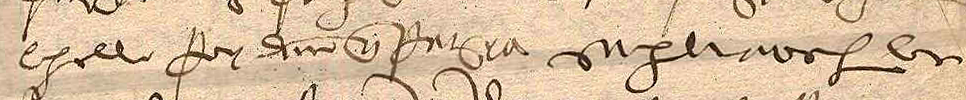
e ꝑ elle foy dito q̄ fazya seu ꝑdor aos Ldos
